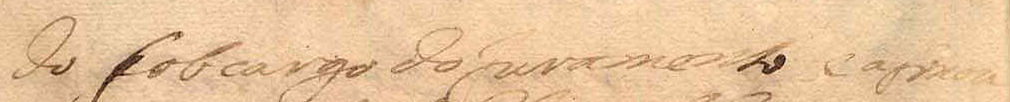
do sob cargo do juramento, e asinou
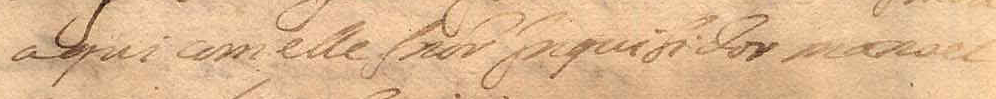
aqui com elle snor̄ Jnquisidor manoel
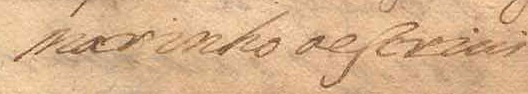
marinho o escreui
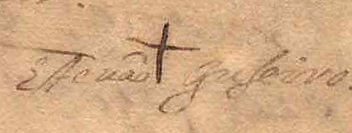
Esteuão + Guseiro
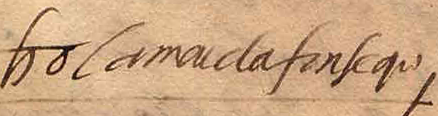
b̄olameu da fonseqa
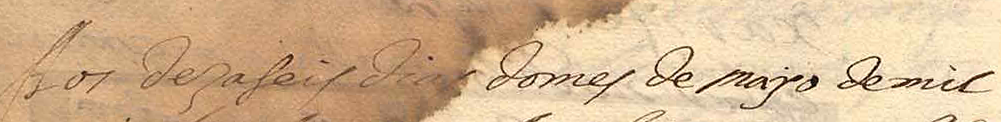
Aos dezaseis dias do mes de mayo de mil
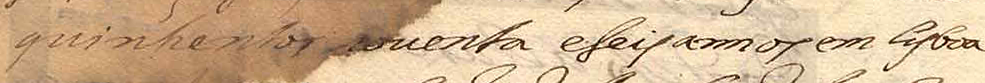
quinhentos nouenta e seis annos em lisboa
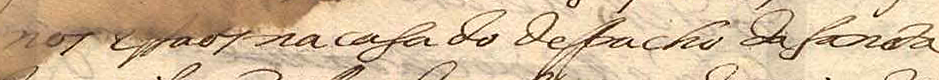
nos Estaos na casa do despacho da sancta
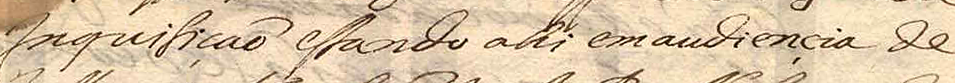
Jnquisiçaõ estando ahi em audiencia de
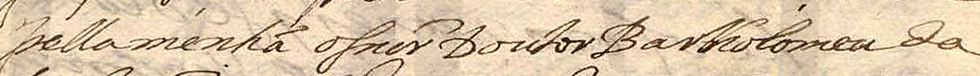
pella menhā o snor̄ Doutor Bartholomeu da
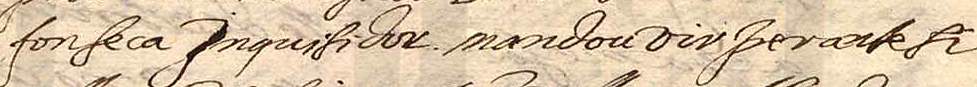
fonseca Jnquisidor mandou vir perante si
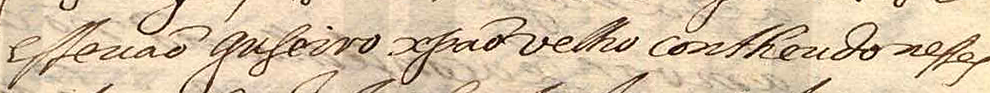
Esteuaõ Guseiro xpaõ velho contheudo nestes
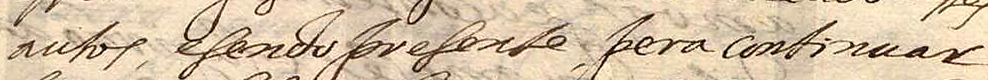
autos, e sendo presente, pera continuar
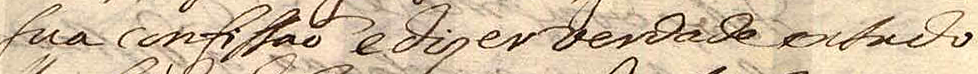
sua confissaõ e dizer verdade en tudo
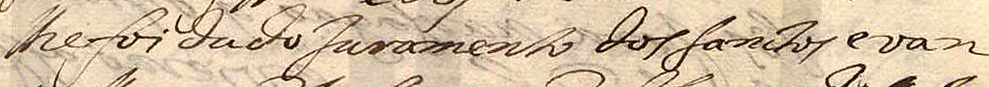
lhe foi dado Juramento dos sanctos evan
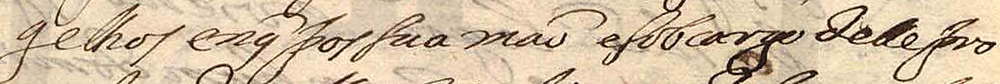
gelhos en q̄ pos sua maõ e sob cargo delle pro
